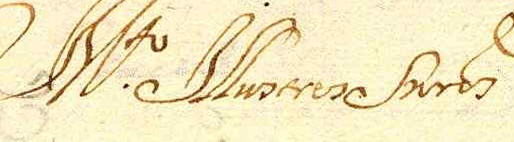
M.to Illustres Snres̄
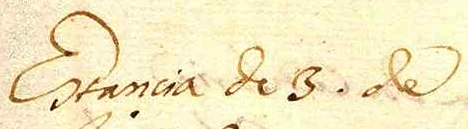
Estancia de 3. de
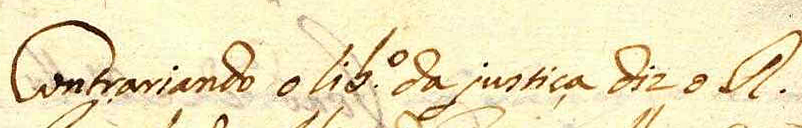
Contrariando o lib.o da justiça diz o R.
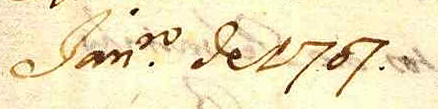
Ian.ro de 1707.
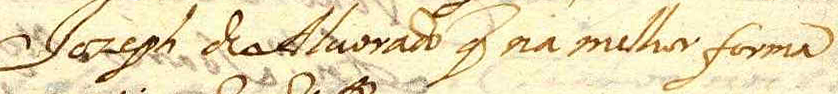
Jozeph de Aluorado q̄ na melhor forma
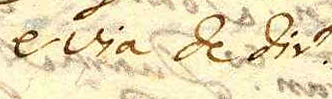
e via de dir.to
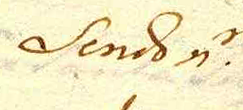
Sendo n.ro
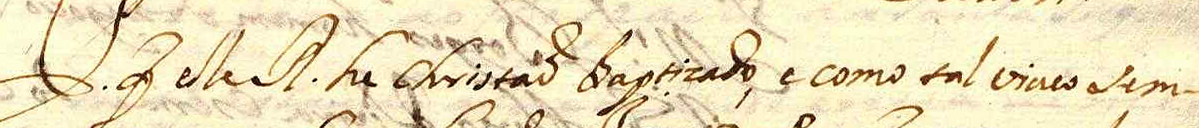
P. q̄ elle R. he christaõ baptizado, e como tal viueo sem
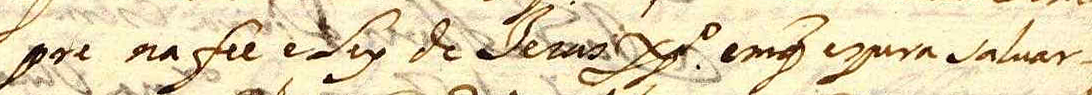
pre na fee e Ley de Iezus Xp.o em q̄ espera saluar
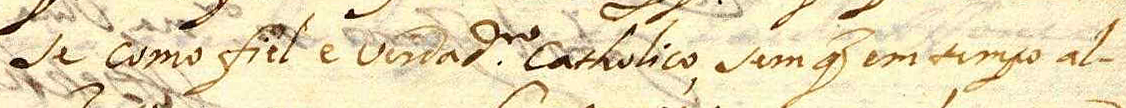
se como fiel e verdad.ro catholico, sem q̄ em tempo al
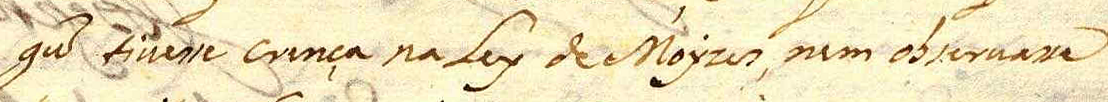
gū tiuesse crença na Ley de Moyzes, nem obseruasse
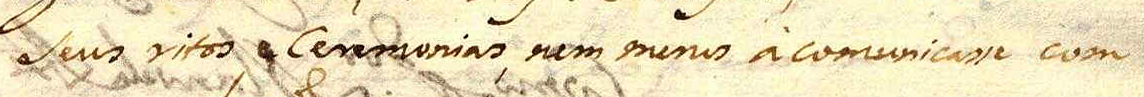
seus ritos e Ceremonias, nem menos a comunicasse com
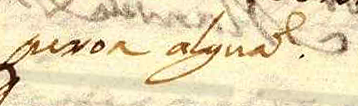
pessoa alguā.
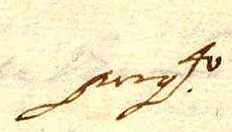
porq.to
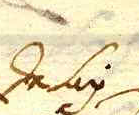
da ley
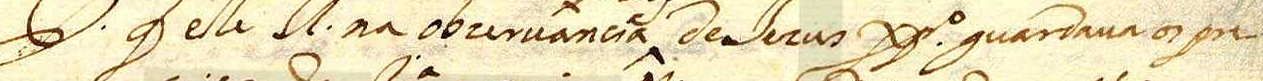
P. q̄ elle R. na obseruancia de Iezus Xp.o guardaua os pre
